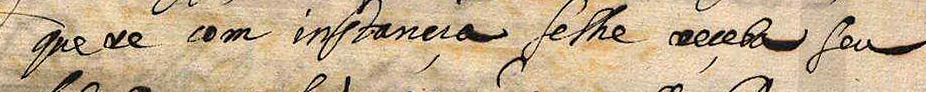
quere com instançia se lhe reçeba seu
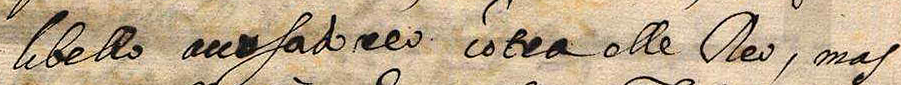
libello accusatoreo cōtra elle Reo, mas
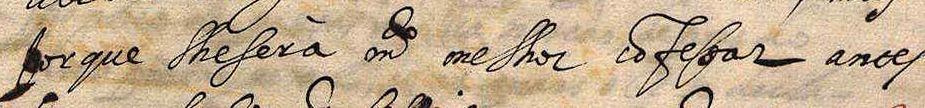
porque lhe serà mto melhor cōfessar antes
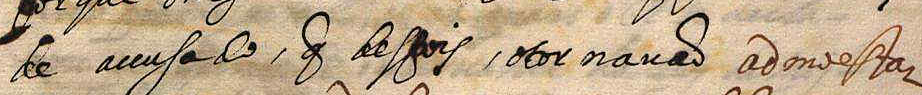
de accusado, q̄ despois, o tornauaõ admoestar
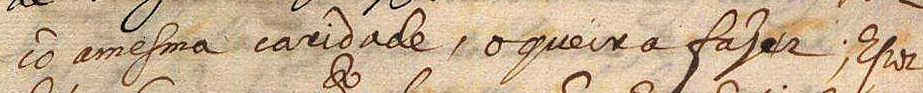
cō a mesma caridade, o queira fazer; E por
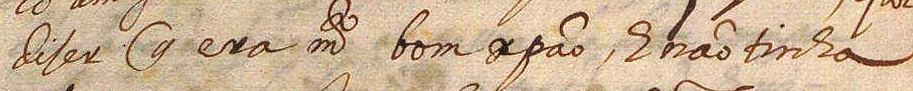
dizer q̄ era mto bom xpão, E naõ tinha
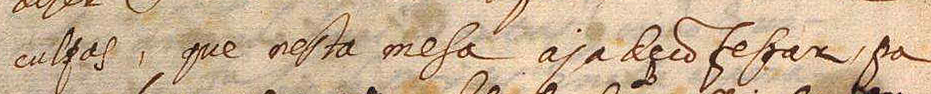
culpas, que nesta mesa aja de cōfessar, pa
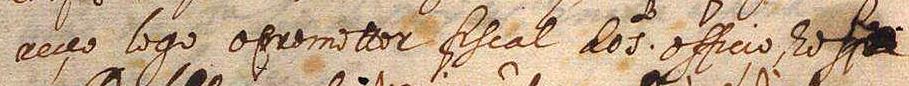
reçeo logo o promottor fiscal do s.to offiçio, E off_
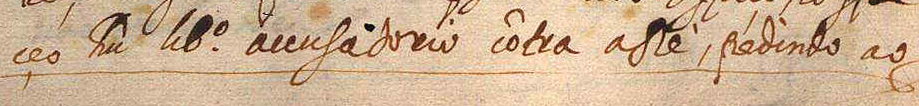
çeo hū lib.o accusatorio cōtra a Ré, pedindo ao
